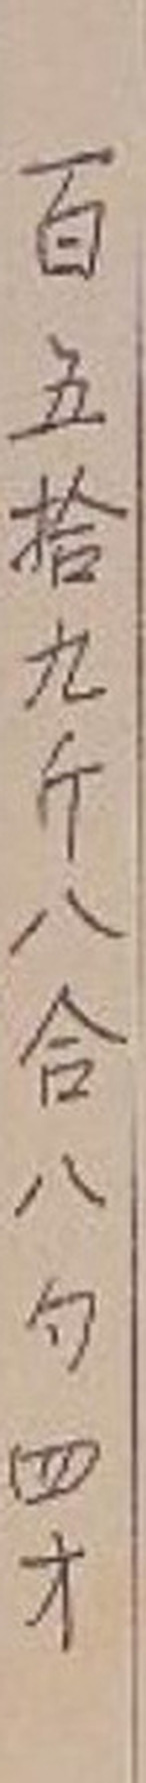百五拾九斤八合八勺四才
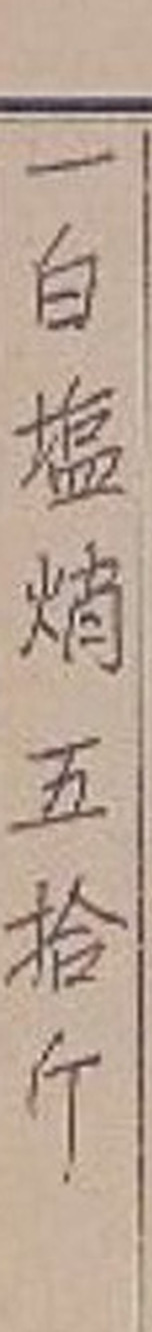一白塩硝五拾斤

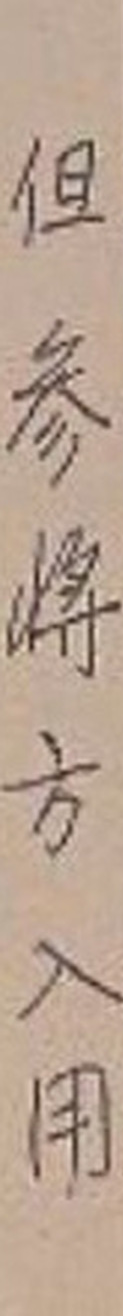但参将方入用
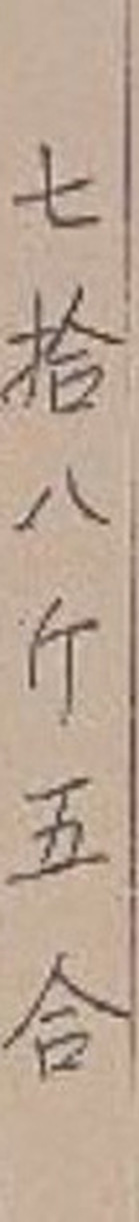七拾八斤五合
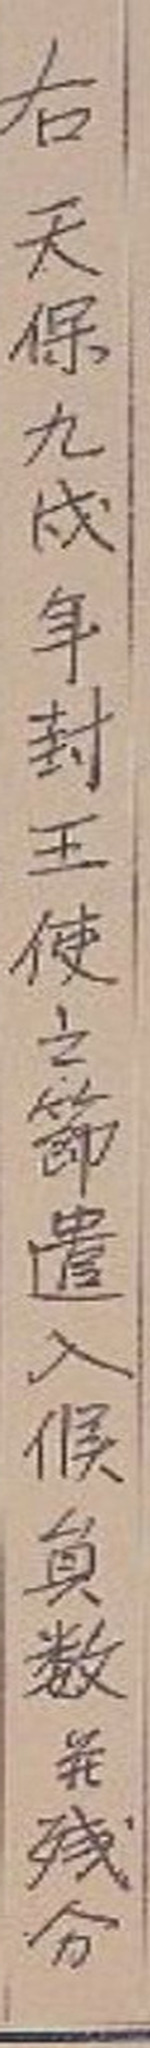右天保九戌年封王使之節遣入候員数并残分
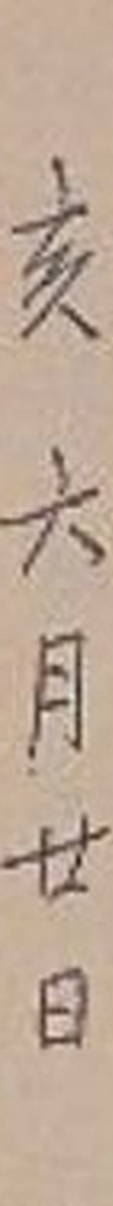亥六月廿日
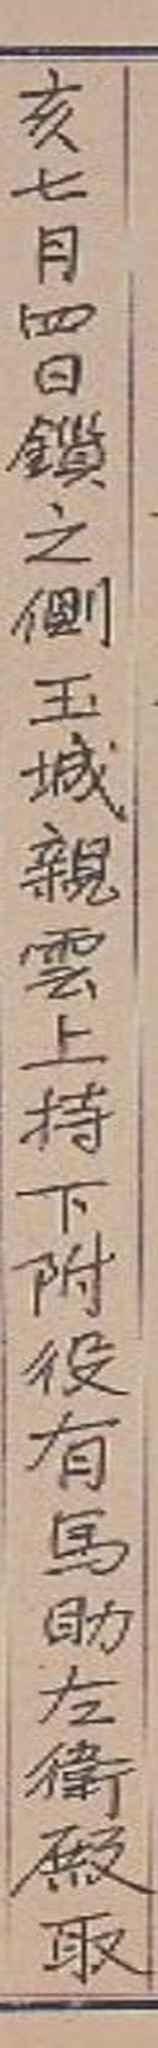亥七月四日鎖之側玉城親雲上持下附役有馬助左衛殿取
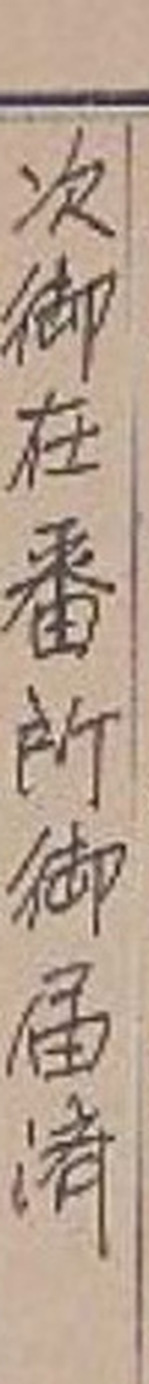次御在番所御届済
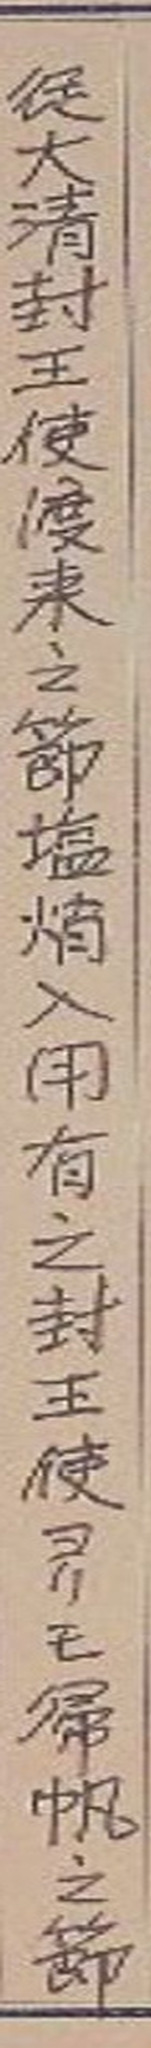従大清封王使渡来之節塩硝入用有之封王使よりも帰帆之節
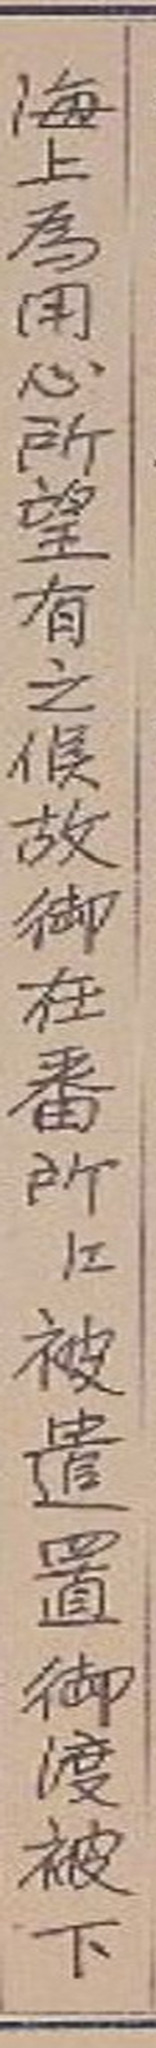海上為用心所望有之候故御在番所え被遣置御渡被下
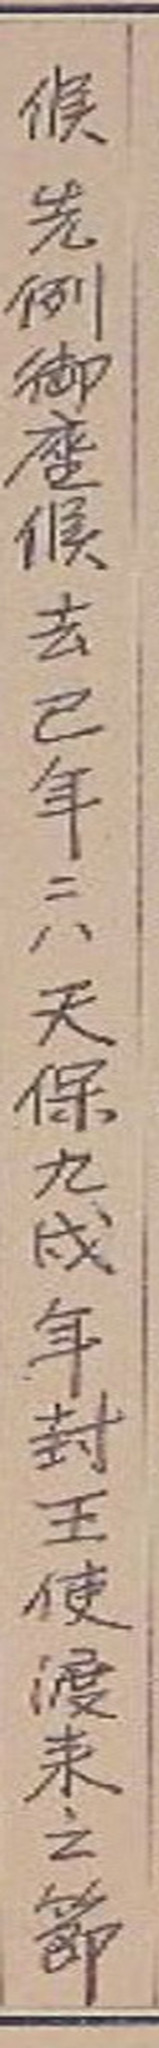候先例御座候去巳年には天保九戌年封王使渡来之節
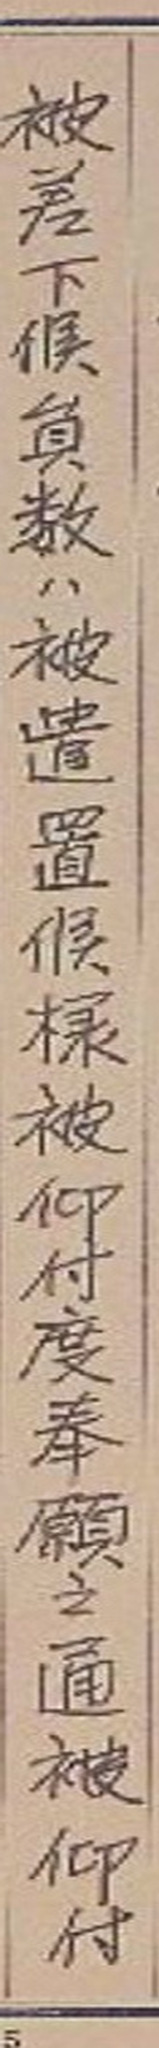被差下候員数は被遣置候様被仰付度奉願之通被仰付
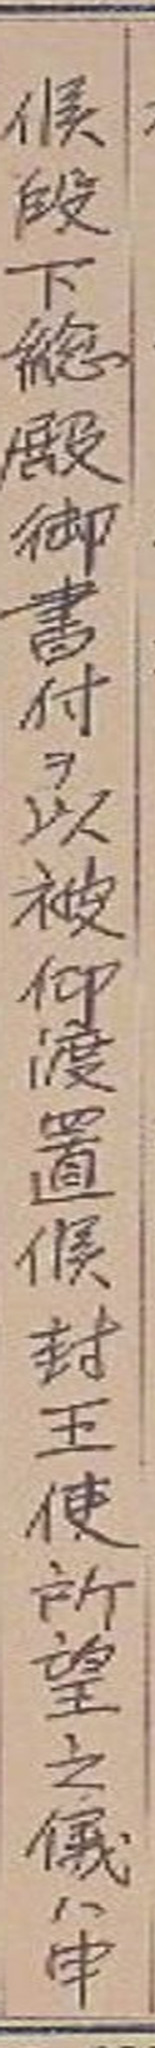候段下総殿御書付を以被仰渡置候封王使所望之儀は申
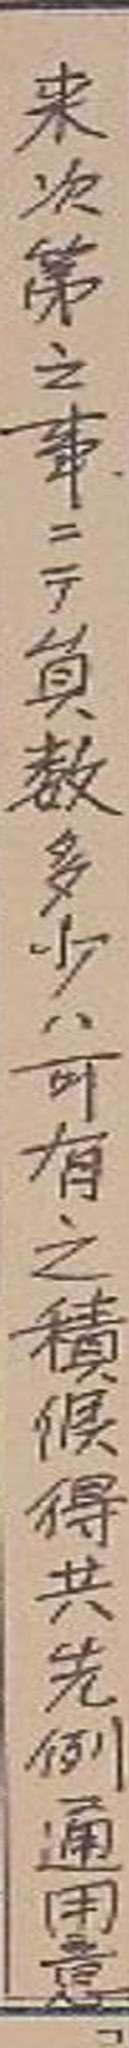来次第之事にて員数多少は可有之積候得共先例通用意
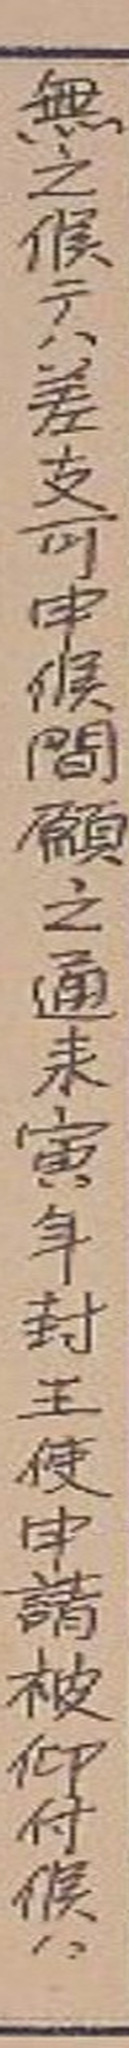無之候ては差支可申候間願之通来寅年封王使申請被仰付候は
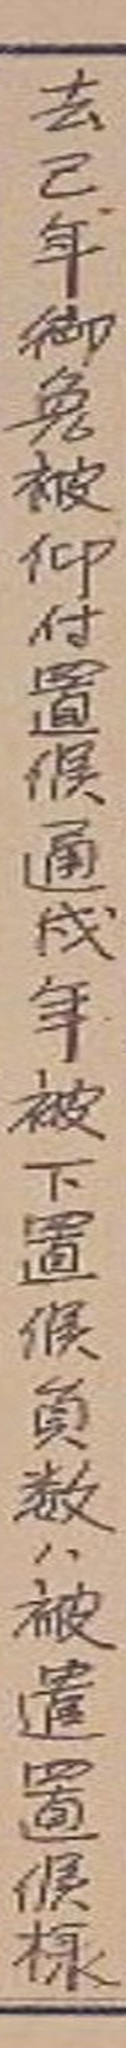去巳年御免被仰付置候通戌年被下置候員数は被遣置候様
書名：支那冊封使来琉諸記 下巻
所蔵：University of the Ryukyus Library
